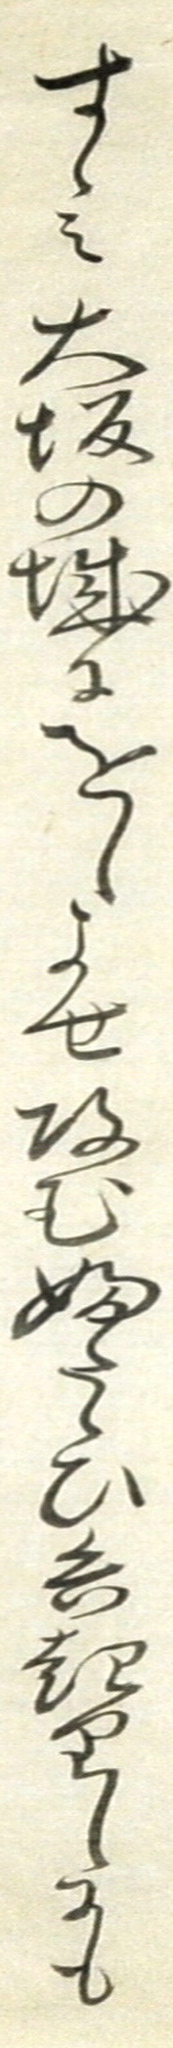すゝみ大坂の城にをしよせ攻むふたゝひ兵起りしにも
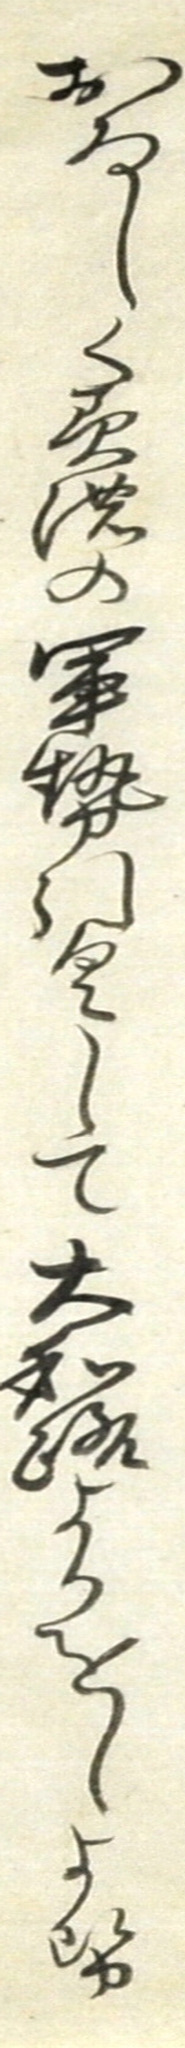おなしく美濃の軍勢引具して大和路よりをしよせ
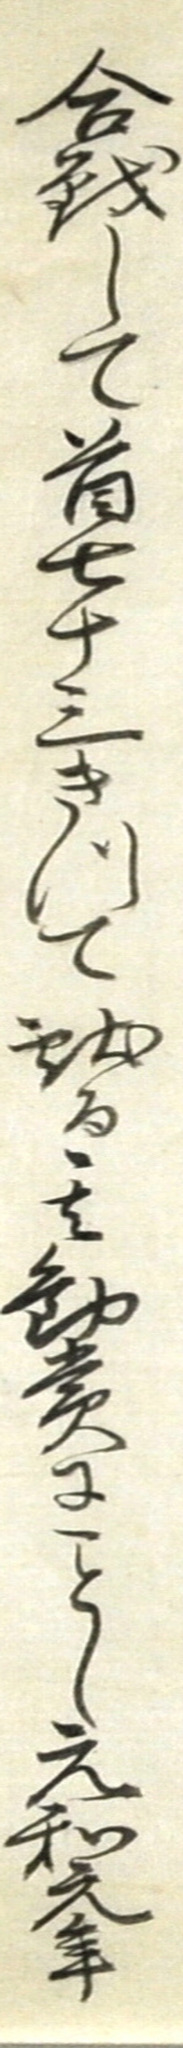合戦して首七十三きつて献る其勧賞にことし元和元年
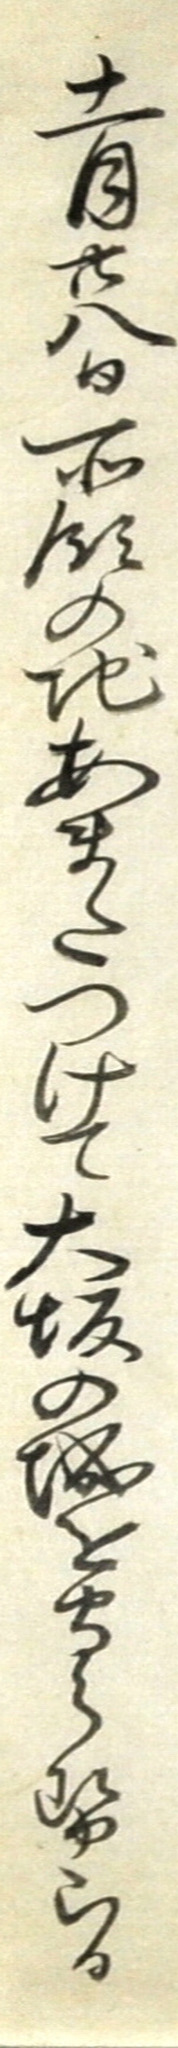十一月廿八日所領の地あまたつけて大坂の城を守らせらる

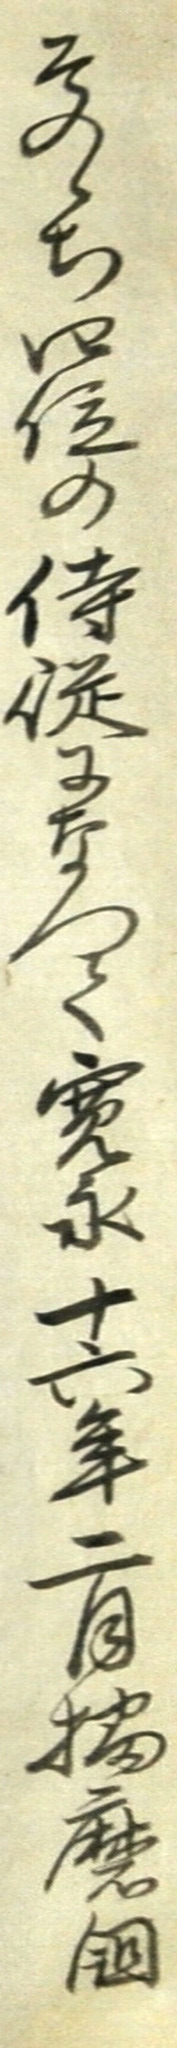そのゝち四位の侍従になつて寛永十六年二月播磨国
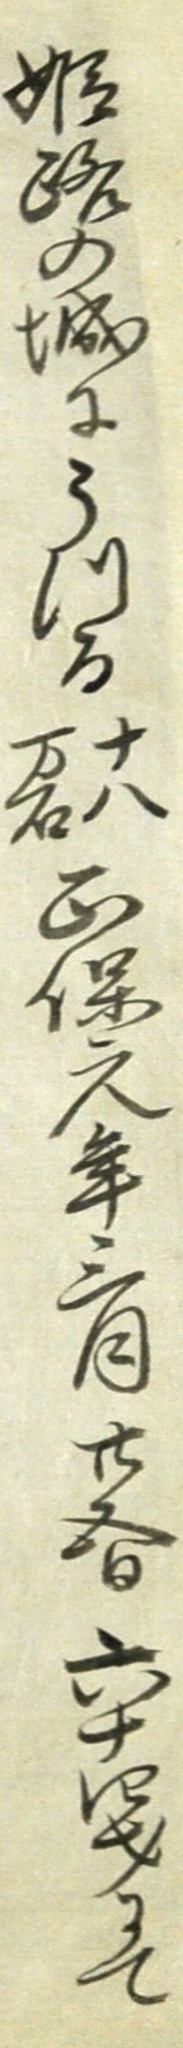姫路の城にうつる十八万石正保元年三月廿五日六十四歳にて
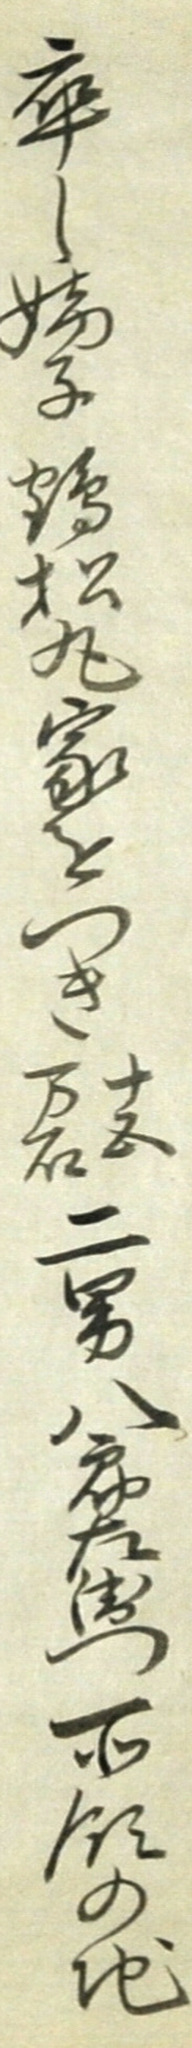卒し嫡子鶴松丸家をつき十五万石二男八郎左衛門所領の地
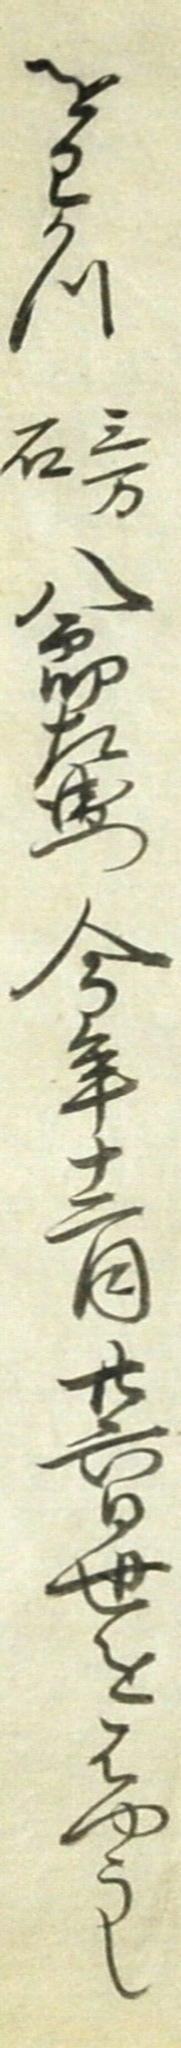をわかつ三万石八郎左衛門今年十二月廿六日世をはやうし
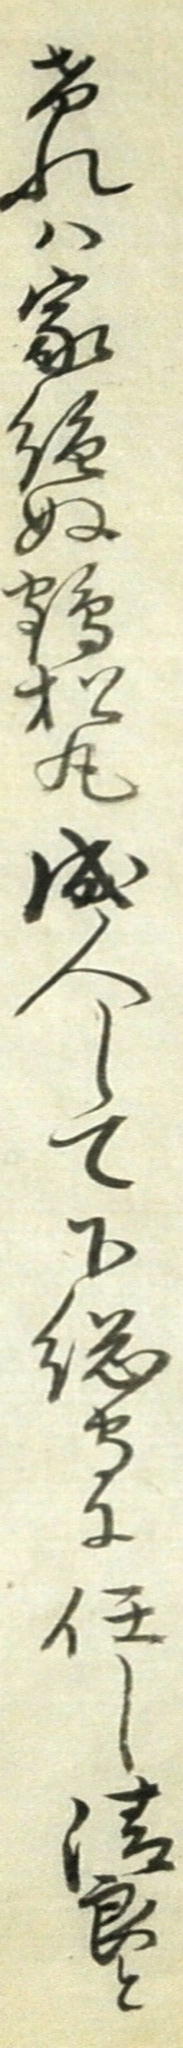けれは家絶ぬ鶴松丸成人して下総守に任し清良と
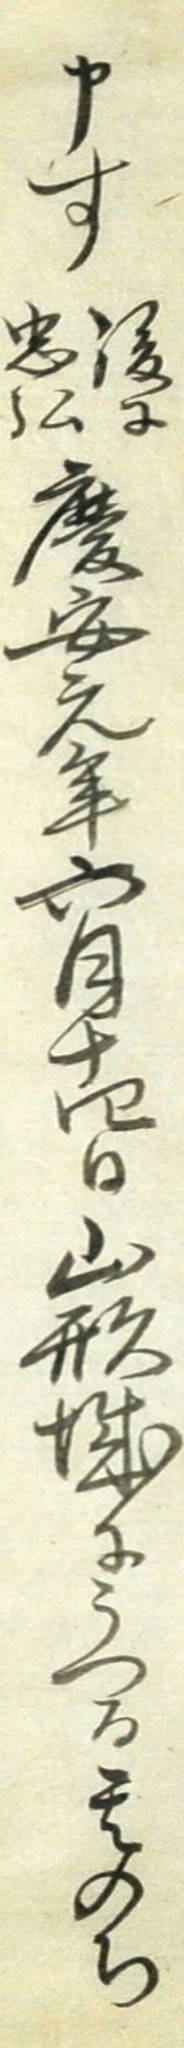申す後に忠弘慶安元年六月十四日山形城にうつる其のち
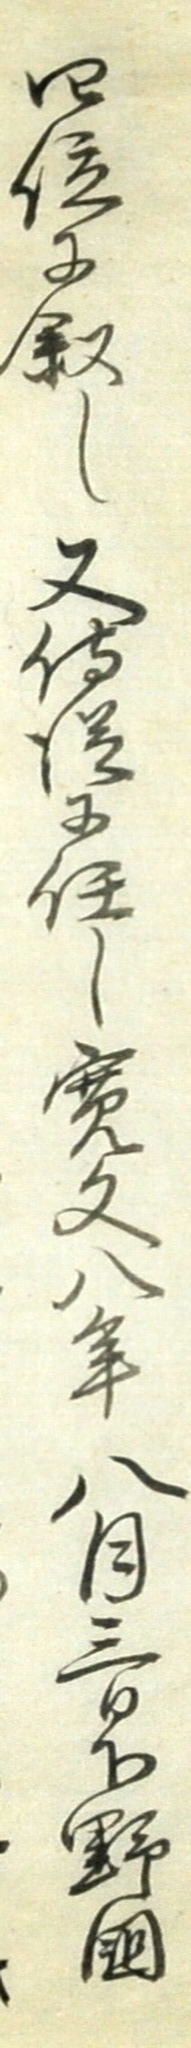四位に叙し又侍従に任し寛文八年八月三日下野国

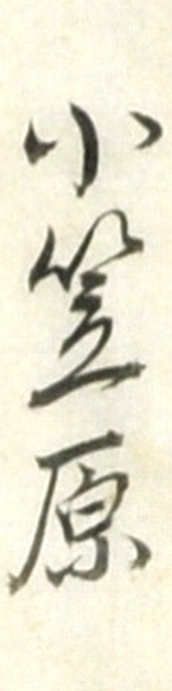小笠原
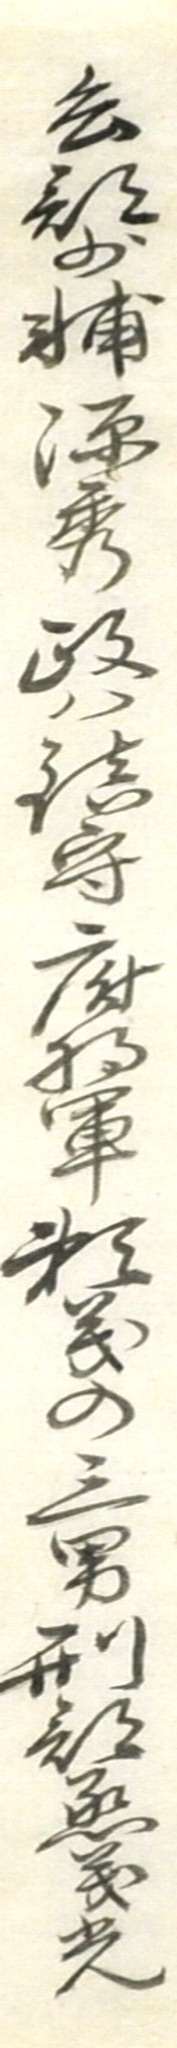兵部少輔源秀政は鎮守府将軍頼義の三男刑部丞義光
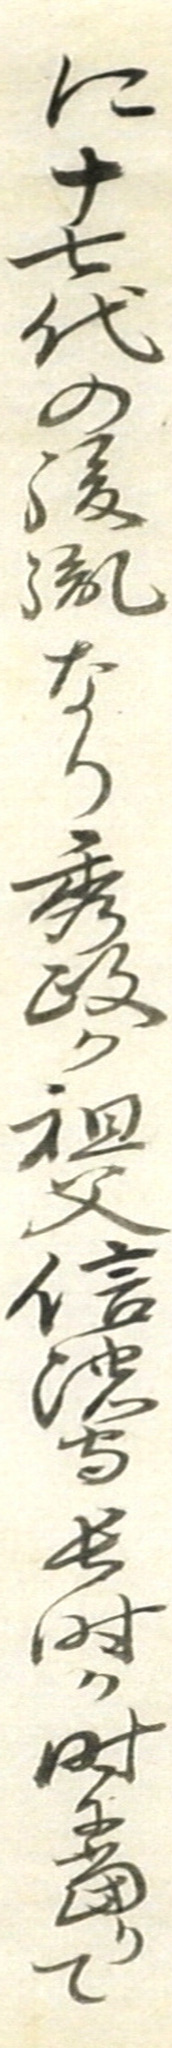に十七代の後胤なり秀政か祖父信濃守長時か時に当りて
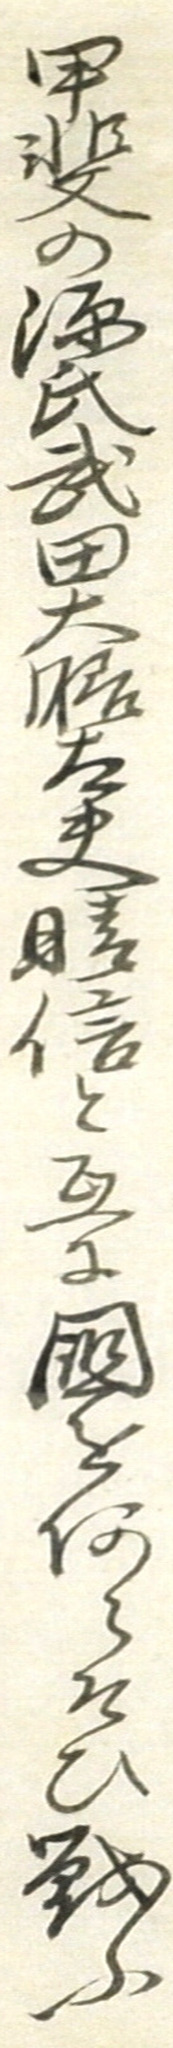甲斐の源氏武田大膳太夫晴信と互に国をあらそひ戦ふ
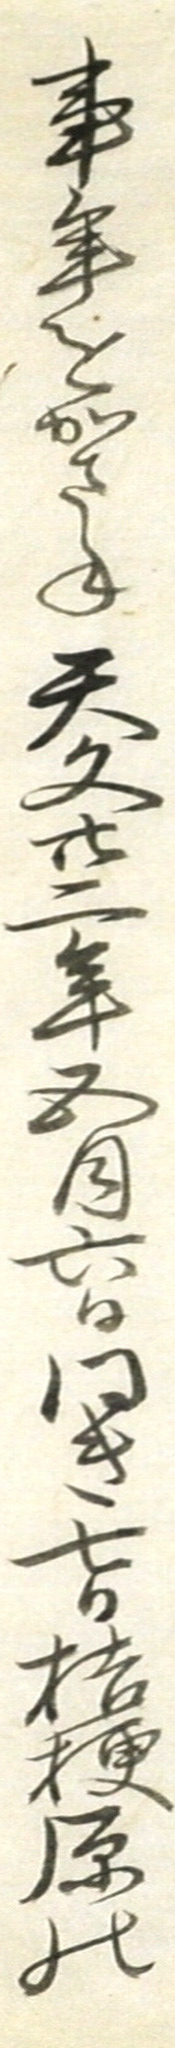事年をかさね天文廿二年五月六日同き七日桔梗原の
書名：藩翰譜（六）
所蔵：伊那市立高遠町図書館・合同会社AMANE
